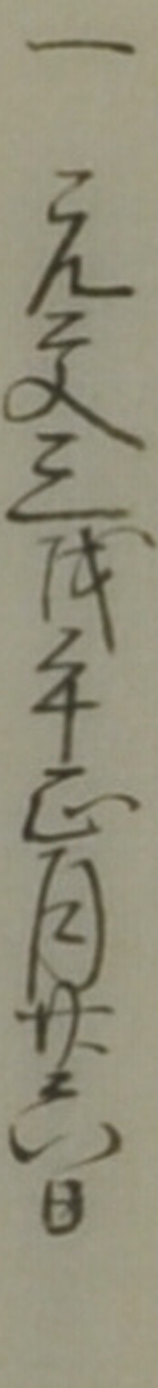一元文三戊午正月廿六日
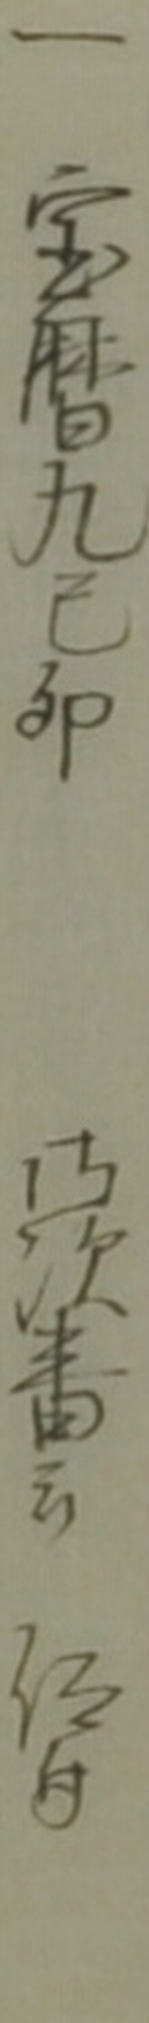一宝暦九己卯御次番被仰付
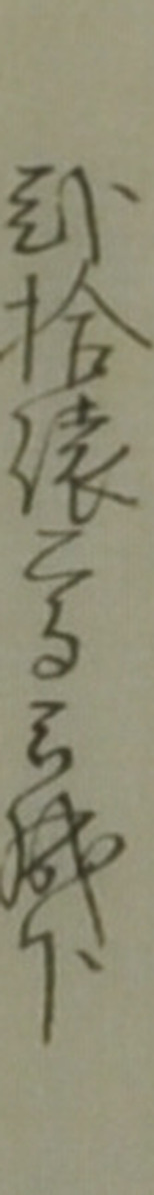弐拾俵高被成下
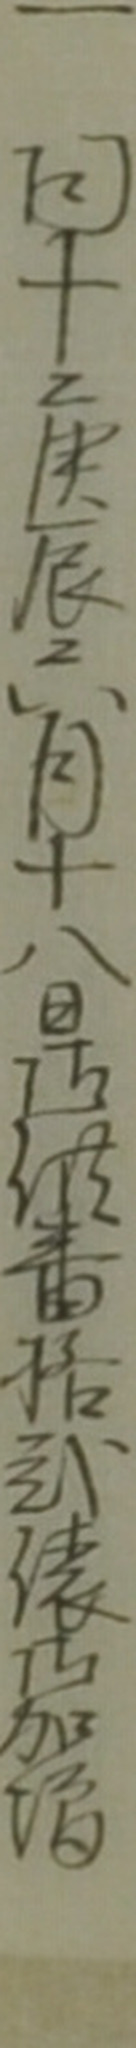一同十庚辰六月十八日御供番格弐俵御加増
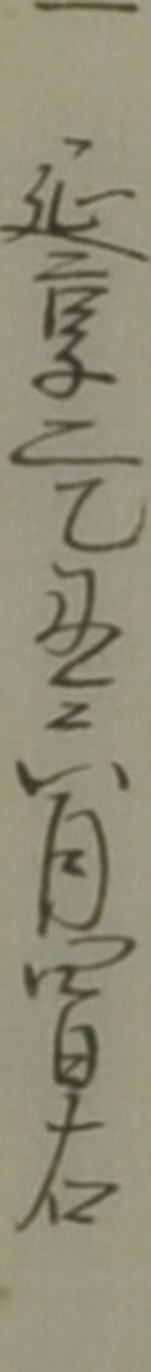一延享二乙丑六月四日右
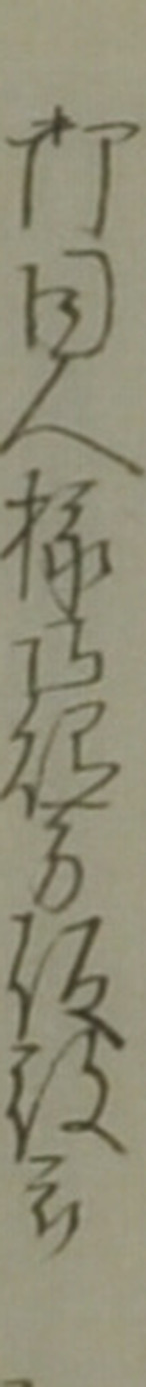御同人様御賄方仮役被仰付
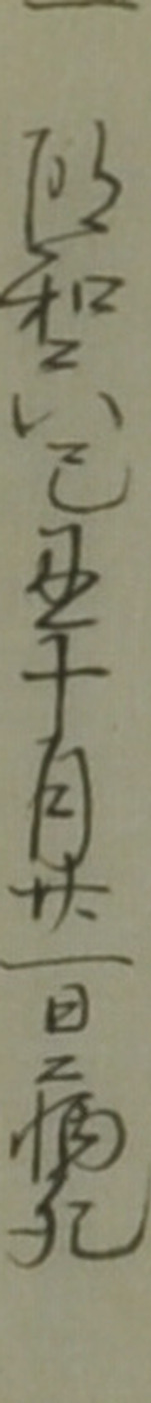一明和六己丑十月廿一日病死
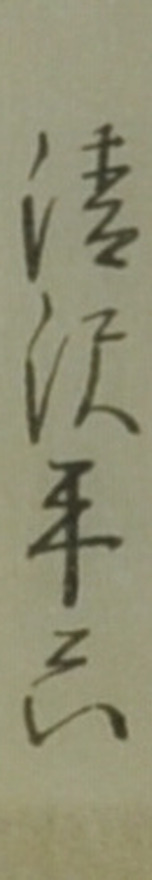清沢平六

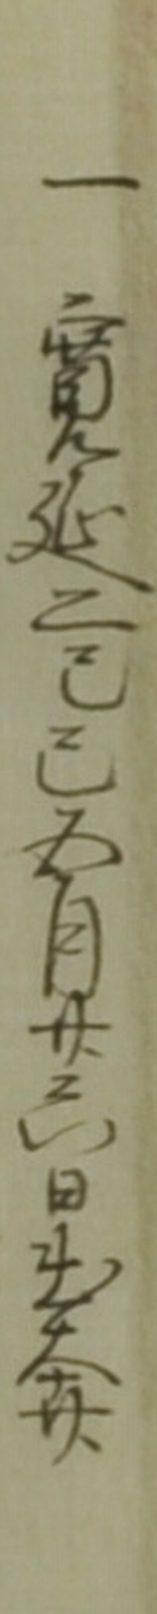一寛延二己巳五月廿六日出奔
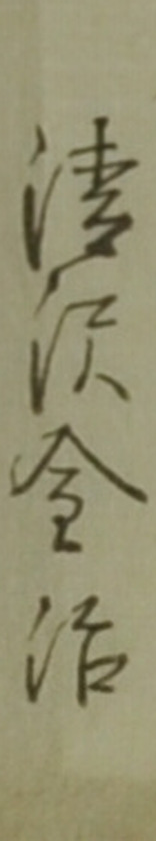清沢金治
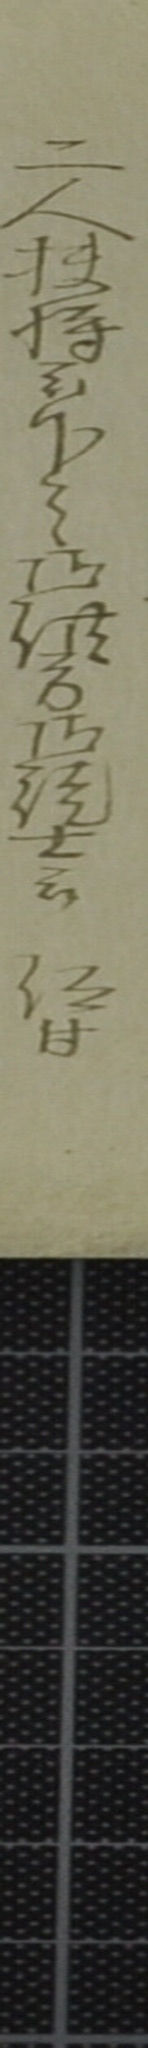二人扶持被下之御供方御徒士被仰付
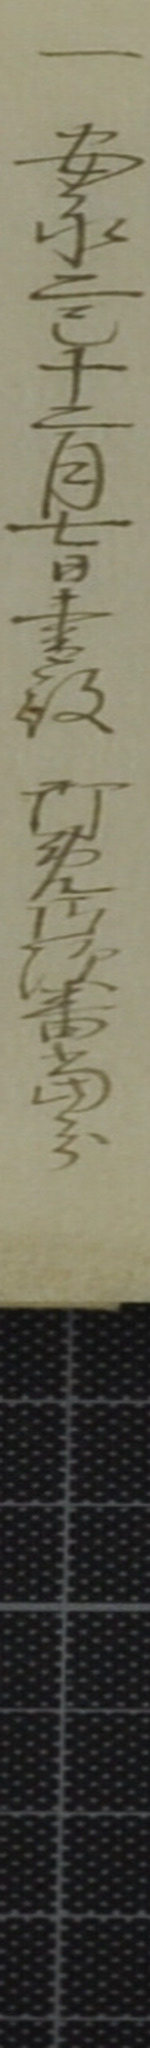一安永二巳十二月七日書役御免御次番当分

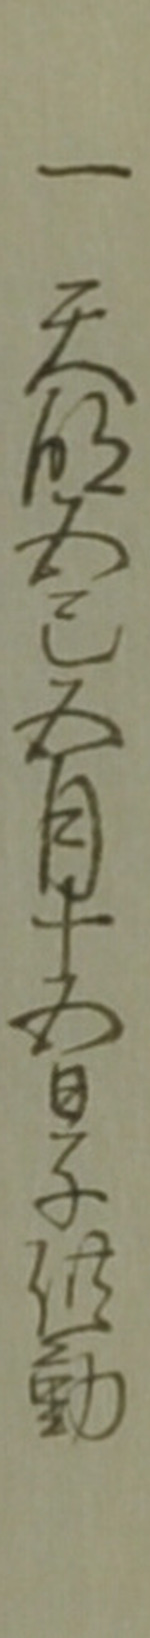一天明五巳五月十五日子供勤
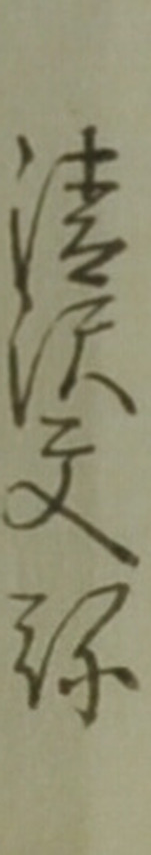清沢文弥
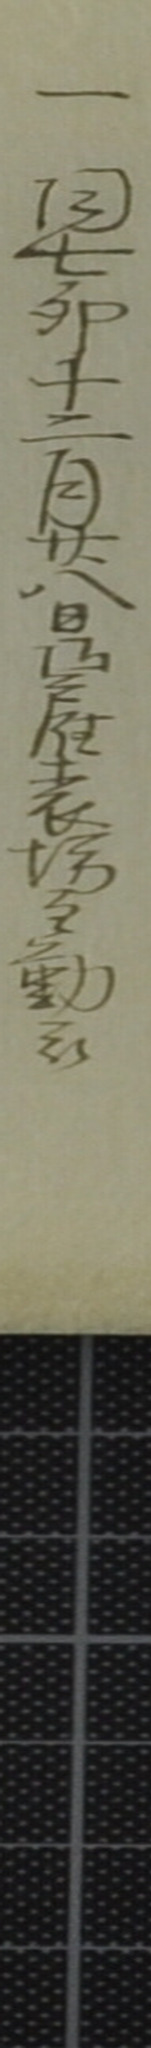一同七卯十二月廿八日御雇表坊主勤被
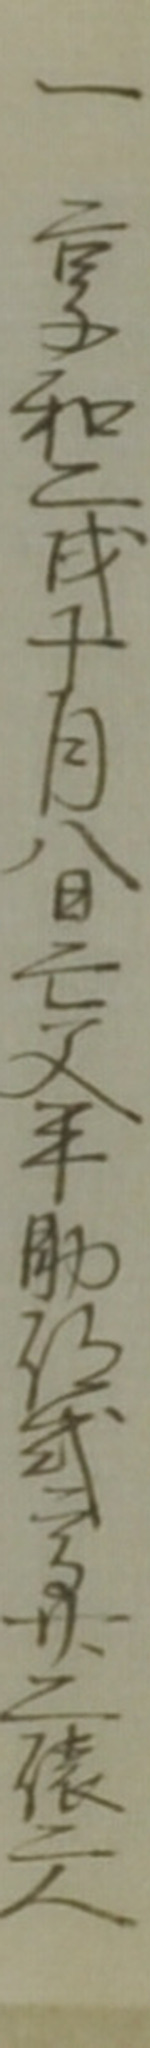一享和二戌十月八日亡父平助跡式高廿二俵二人
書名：無足諸士勤仕録（三）
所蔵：伊那市立高遠町図書館・合同会社AMANE
